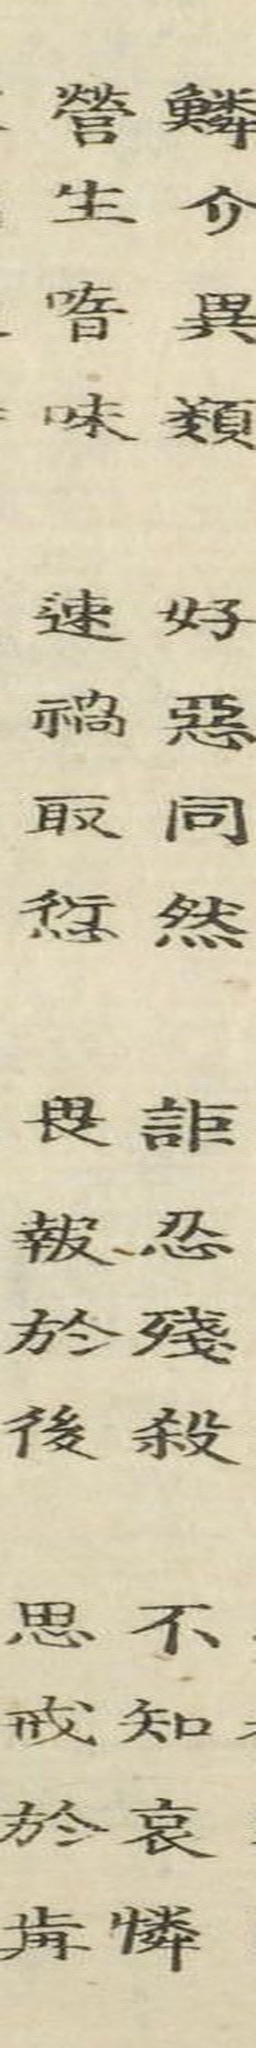営生味速禍取愆畏報於後思戒於肯
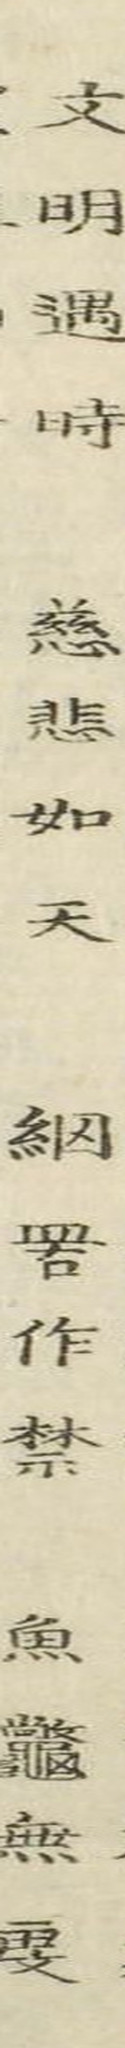文明遇時慈悲如天網罟作禁魚龞無度
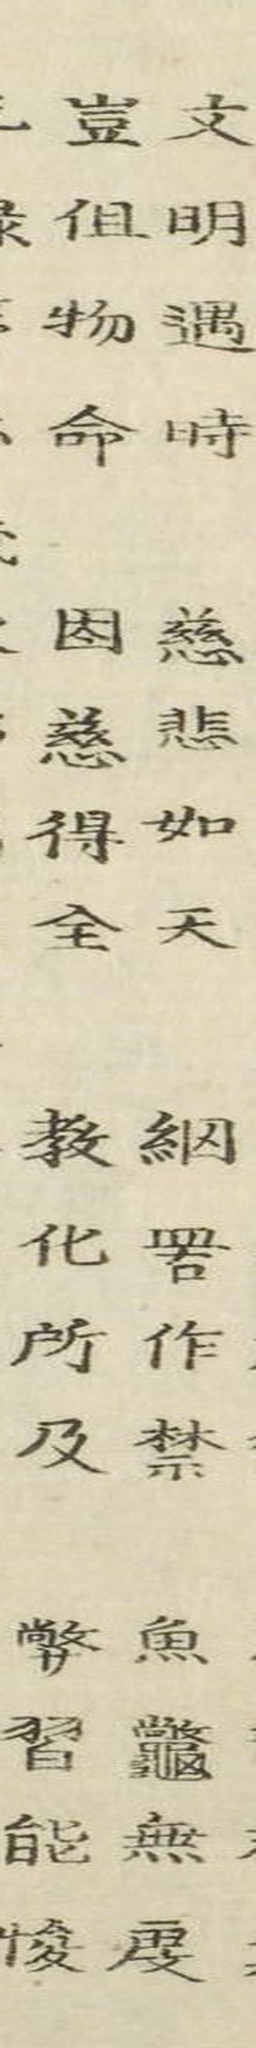豈伹物命因慈得全教化所及弊習能悛
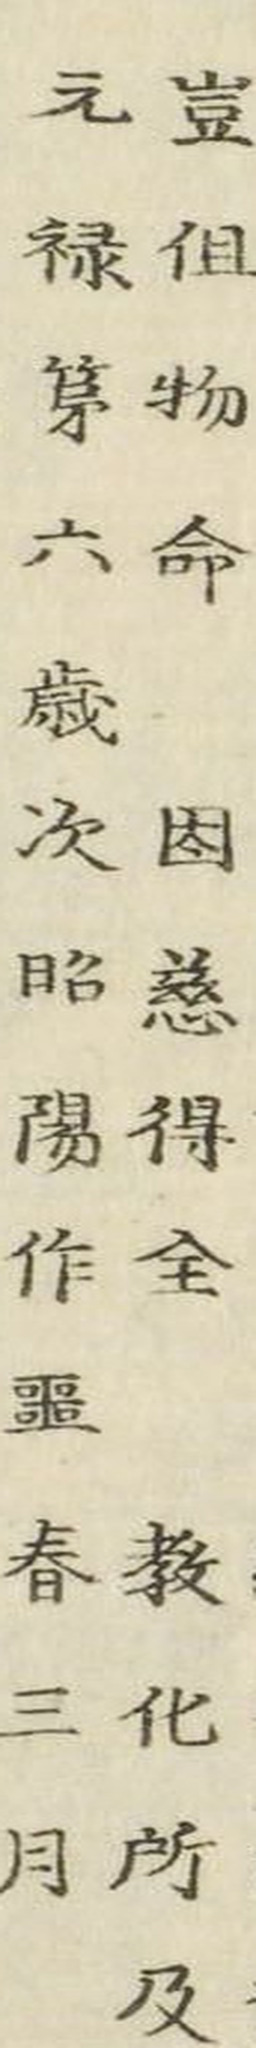元禄第六歳次昭陽作噩春三月
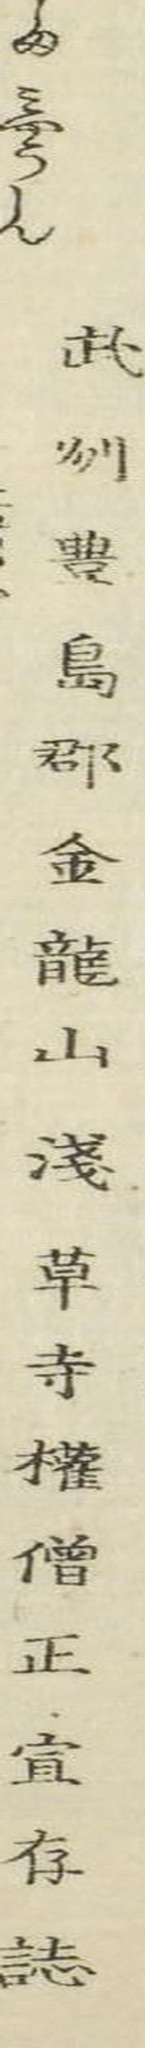武州豊島郡金龍山浅草寺権僧正宣存誌
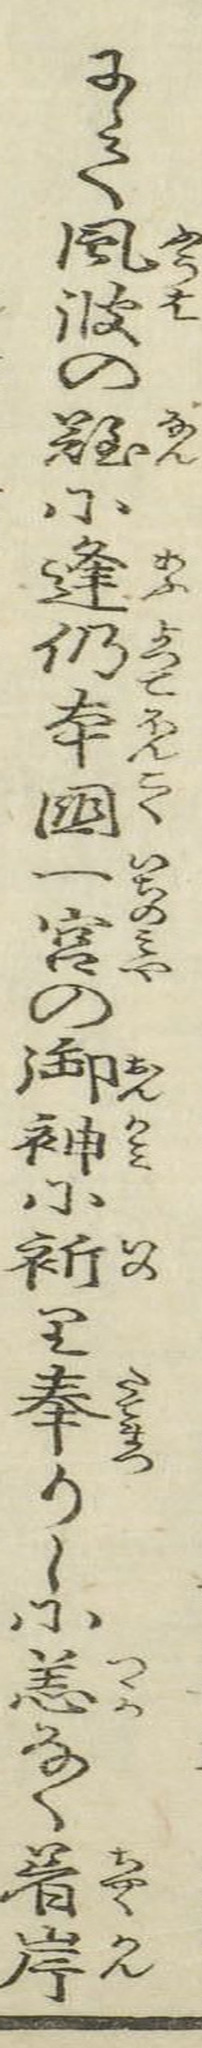にて風波の難に逢仍本国一宮の御神に祈り奉りしに恙なく着岸
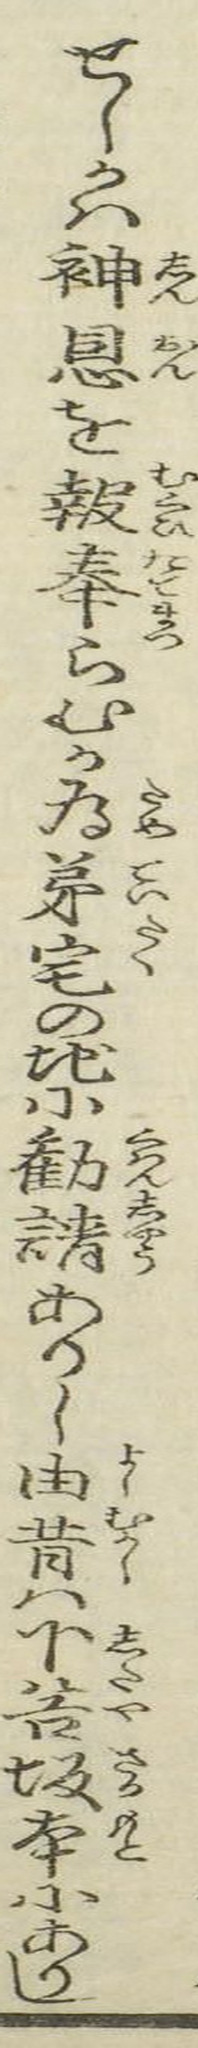せしかは神恩を報奉らむか為弟宅の地に勧請ありし由昔は下谷坂本にありし
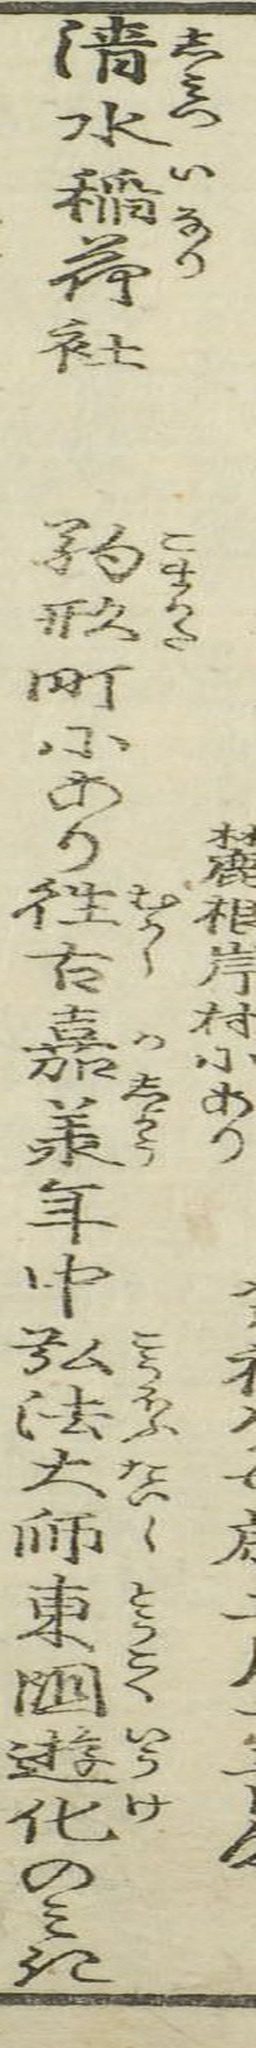清水稲荷社駒形町にあり往古嘉承年中弘法大師東国遊化のみき
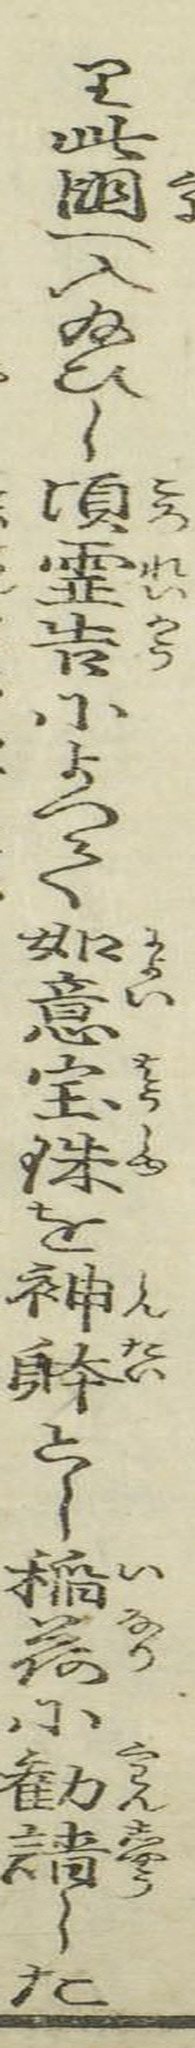り此国へ入給ひし頃霊告によつて如意宝珠を神体とし稲荷に勧請した

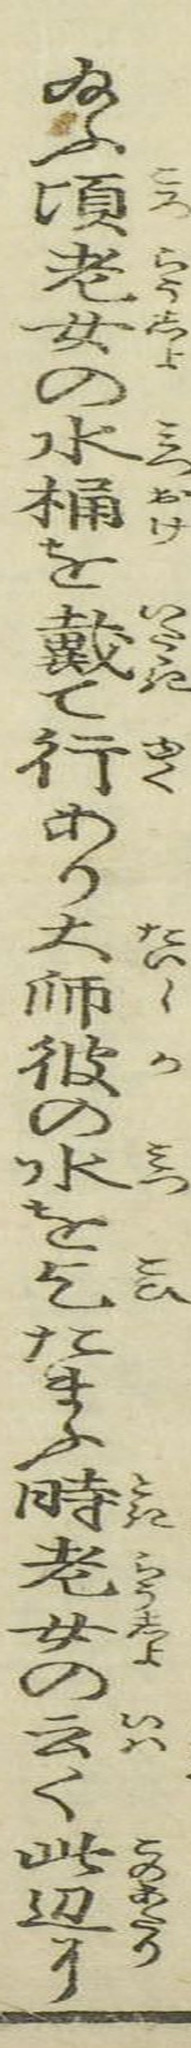給ふ頃老女の水桶を戴て行あり大師彼の水を乞たまふ時老女の云く此辺に
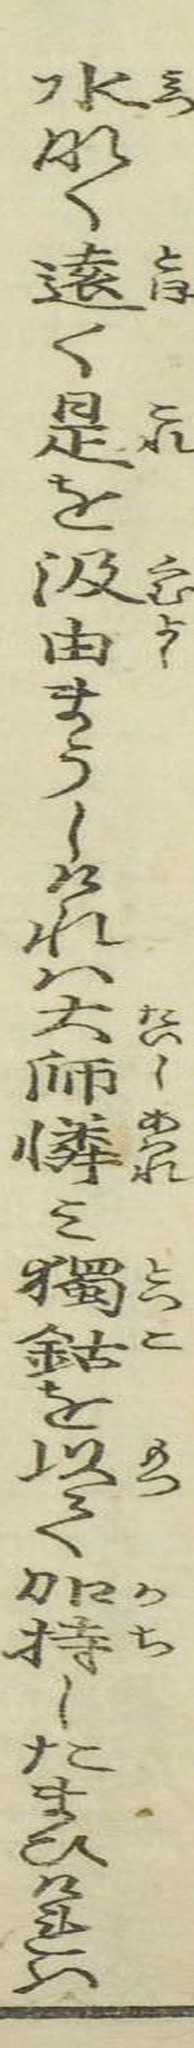水なく遠く是を汲由まうしけれは大師憐み独鈷を以て加持したまひけれは
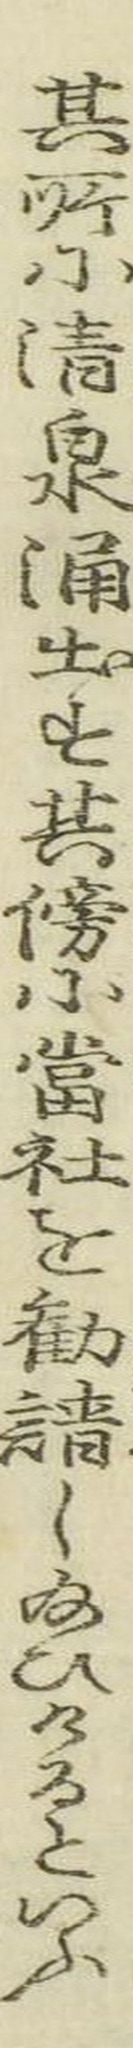其所に清泉涌出す其傍に当社を勧請し給ひけるといふ
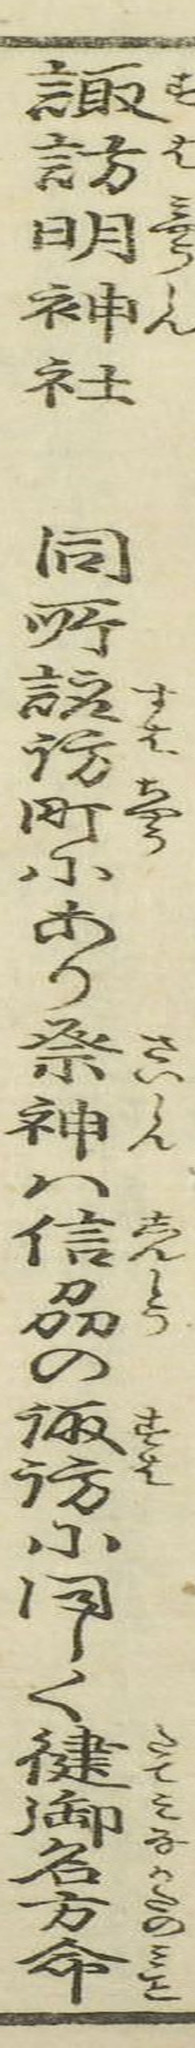諏訪明神社同所諏訪町にあり祭神は信州の諏訪に同しく健御名方命
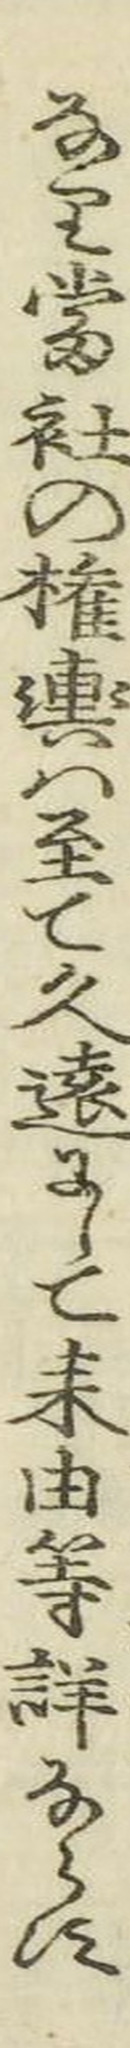なり当社の権輿は至て久遠にして来由等詳ならす
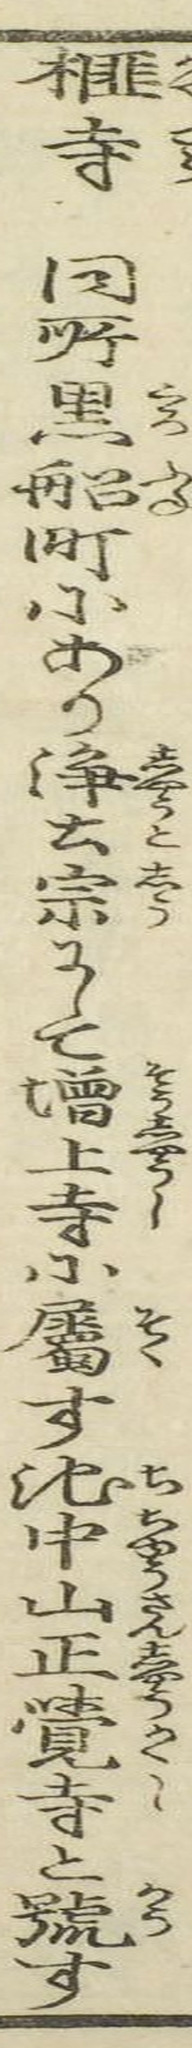榧寺同所黒船町にあり浄土宗にして増上寺に属す池中山正覚寺と号す
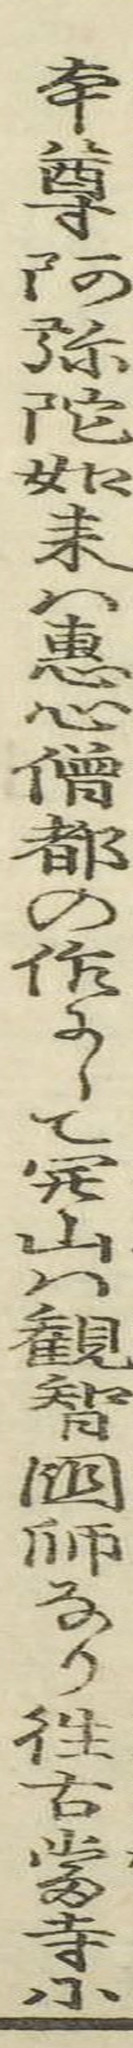本尊阿弥陀如来は恵心僧都の作にして開山は観智国師なり往古当寺に
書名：江戸名所図会 20巻 巻之16
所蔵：東京学芸大学教育コンテンツアーカイブ
